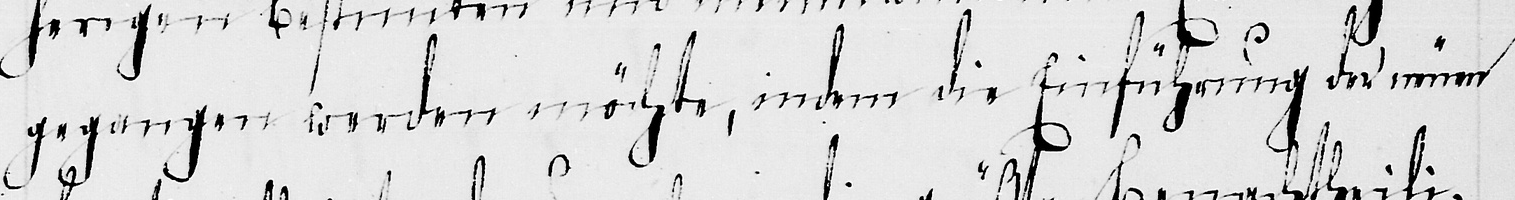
gegangen werden möchte, indem die Einführung der neuen
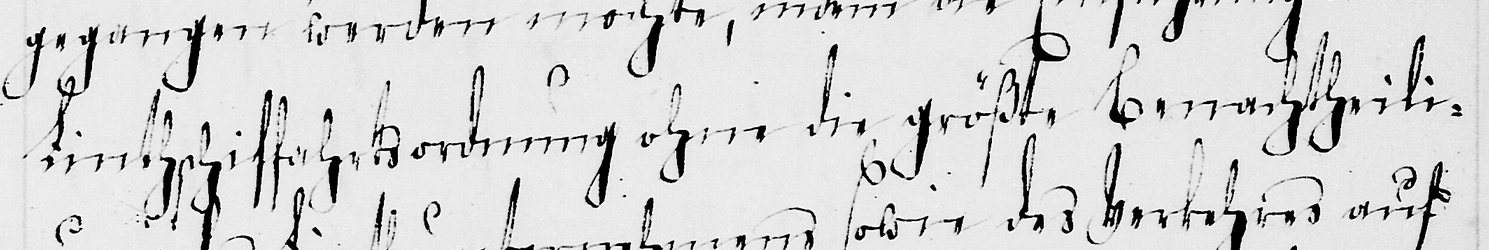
Linthschiffahrtsordnung ohne die größte Benachtheili¬
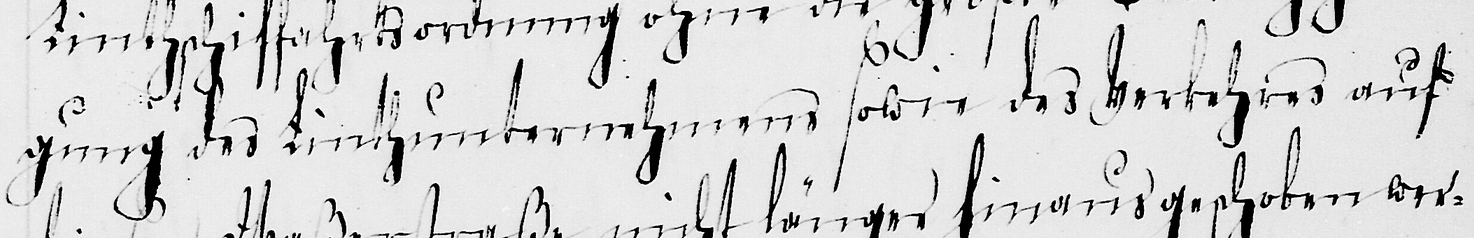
gung des Linthunternehmens sowie des Verkehres auf
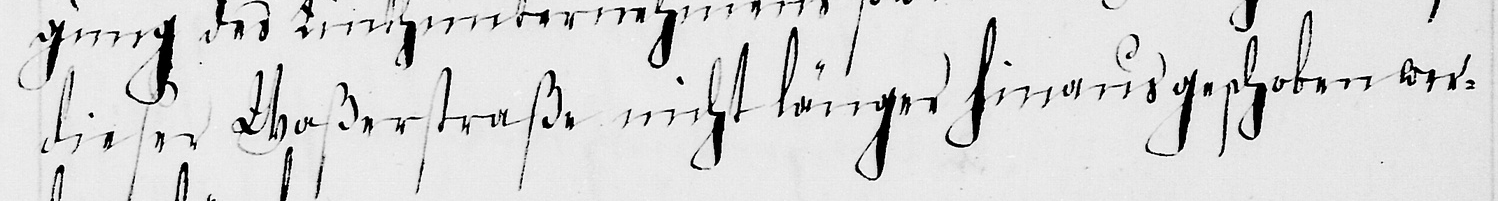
dieser Waßerstraße nicht länger hinausgeschoben wer¬
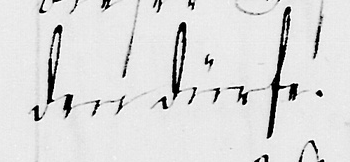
den dürfe.
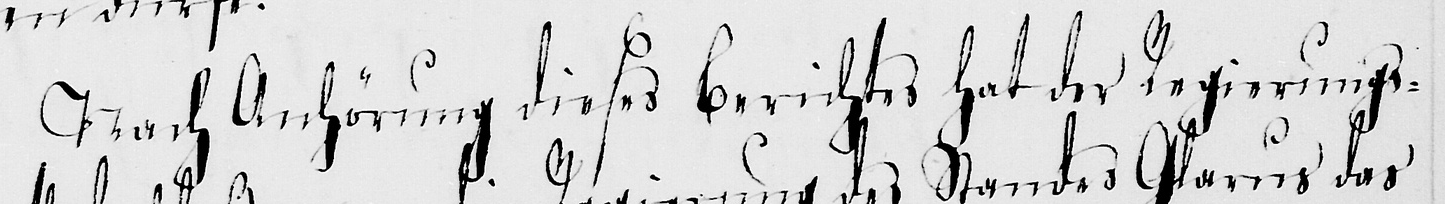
Nach Anhörung dieses Berichtes hat der Regierungs¬
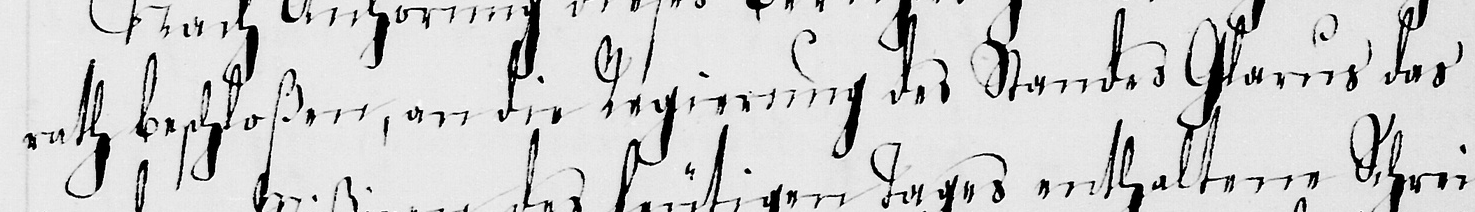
rath beschloßen, die Regierung des Standes Glarus das
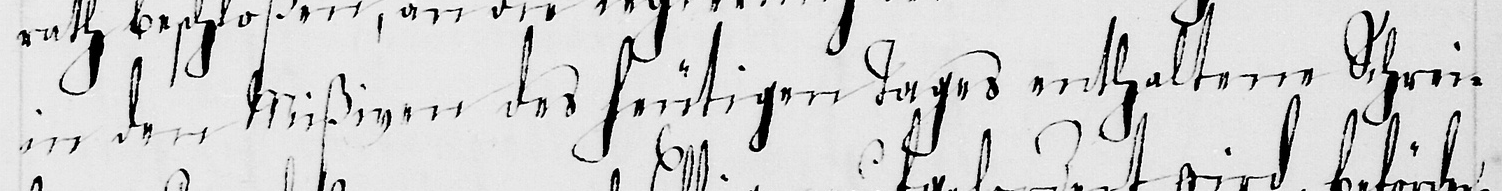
in den Mißiven des heutigen Tages enthaltene Schrei¬
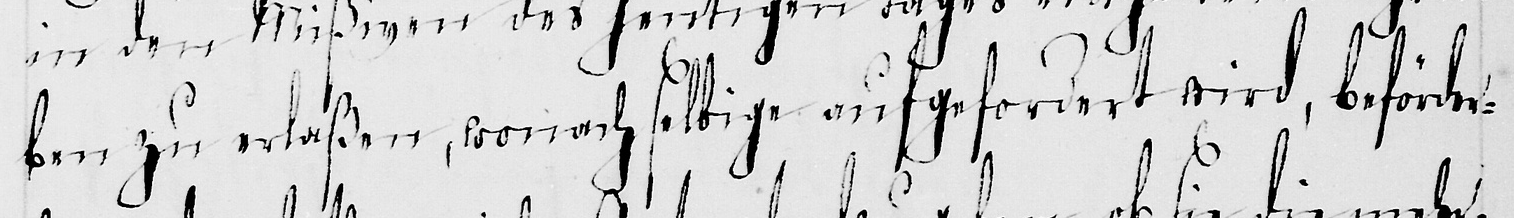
ben zu erlaßen, wonach selbige aufgefordert wird, beförder¬
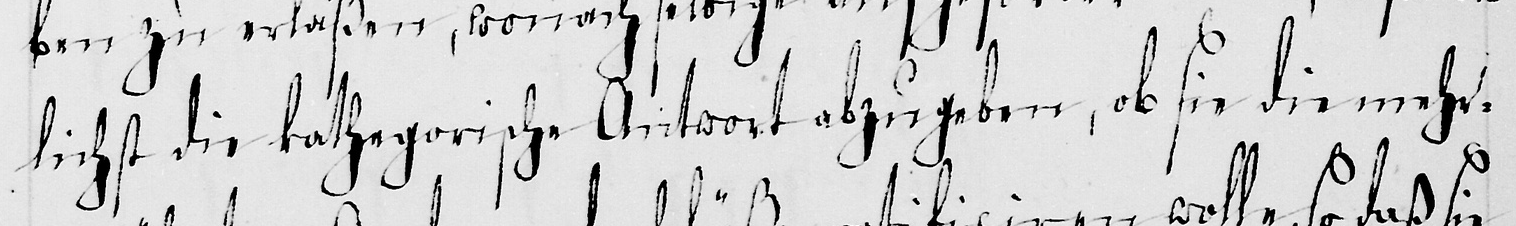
lichst die kathegorische Antwort abzugeben, ob sie die mehr¬
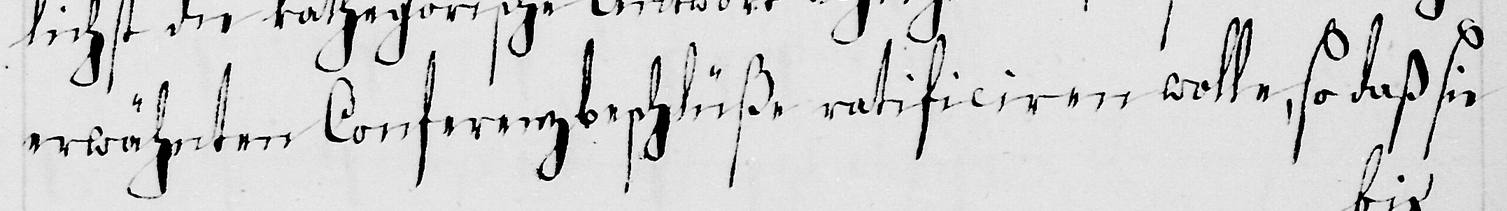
erwähnten Conferenzbeschlüße ratificiren wolle, so daß sie
